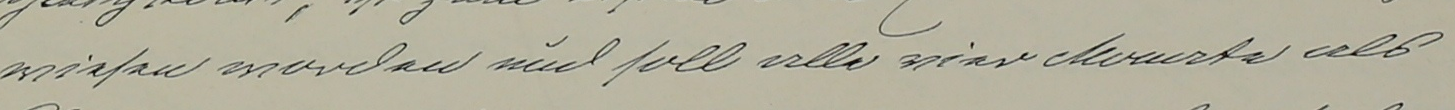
wiesen worden und soll alle vier Monate als
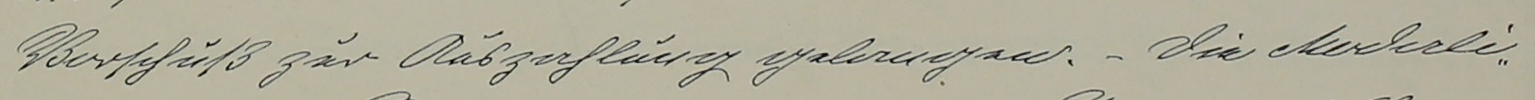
Vorschuß zur Auszahlung gelangen. – Die Modali-
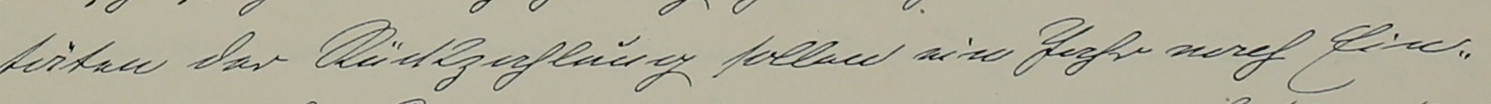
täten der Rückzahlung sollen ein Jahr nach Ein-
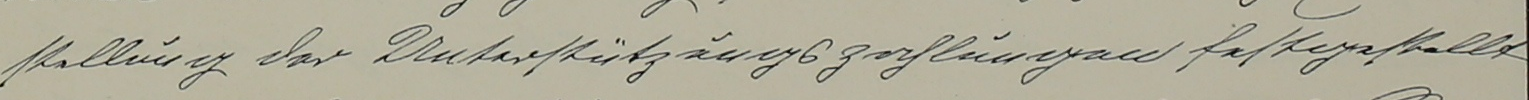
stellung der Unterstützungszahlungen festgestellt
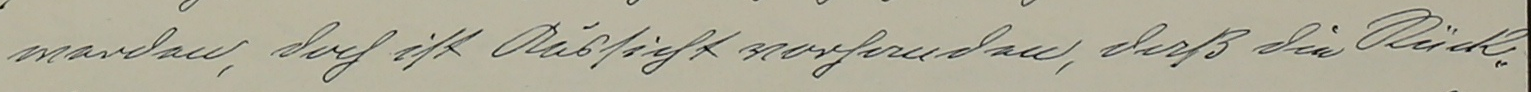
werden, doch ist Aussicht vorhanden, daß die Rück-
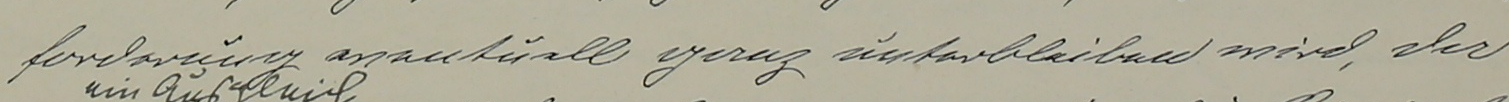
forderung eventuell ganz unterbleiben wird, da
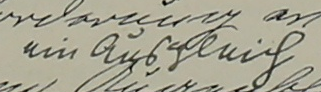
ein Ausgleich
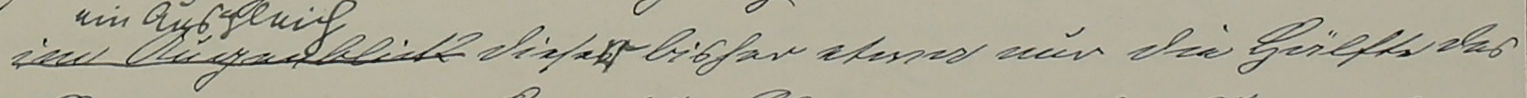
im Augenblick dieser bisher etwa nur die Hälfte des
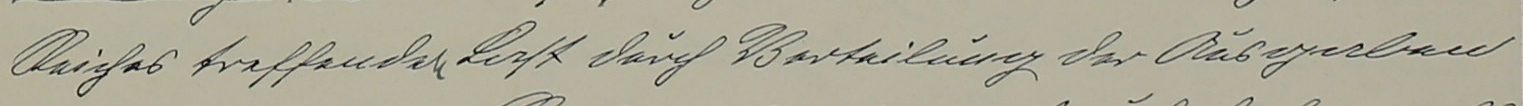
Reiches treffenden Last durch Verteilung der Ausgaben
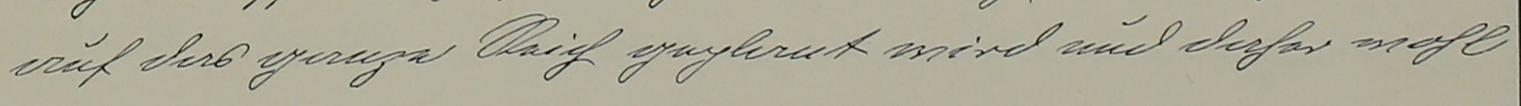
auf das ganze Reich geplant wird und daher wohl
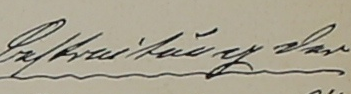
Bestreitung der
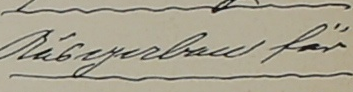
Ausgaben für
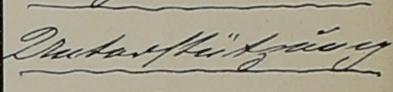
Unterstützung
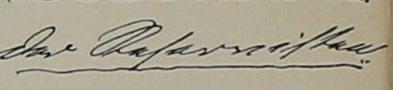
der Reservisten-
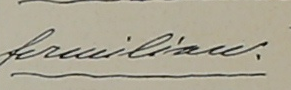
familien.
